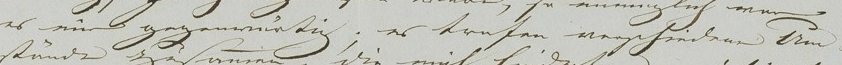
es mir gegenwärtig; es trafen verschiedene Um-
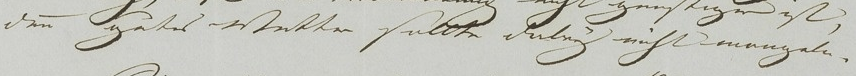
denn gutes Wetter sollte dabey nicht mangeln.
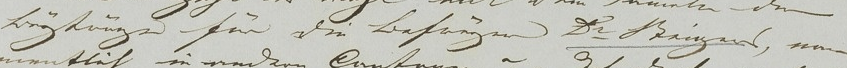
Beyträge für die Befreyer DrSteigers, na-
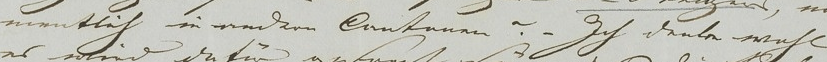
mentlich in andern Cantonen? – Ich denke wohl
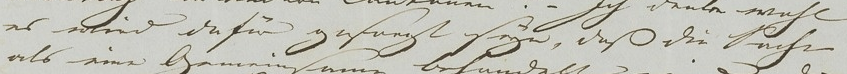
es wird dafür gesorgt seyn, daß die Sache
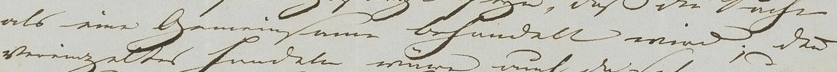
als eine Gemeinsame behandelt wird, denn
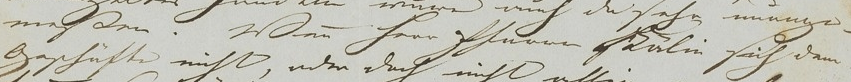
meßen. Wenn Herr Pfarrer Kälin sich dem
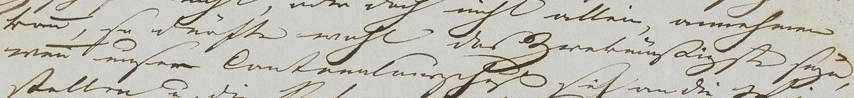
kann, so dürfte wohl das Zwekmäßigste seyn,
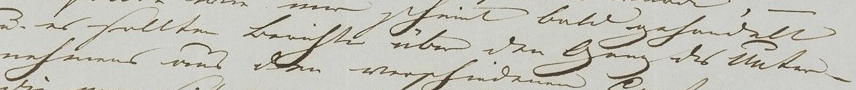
u. es sollten Berichte über den Gang der Unter-
